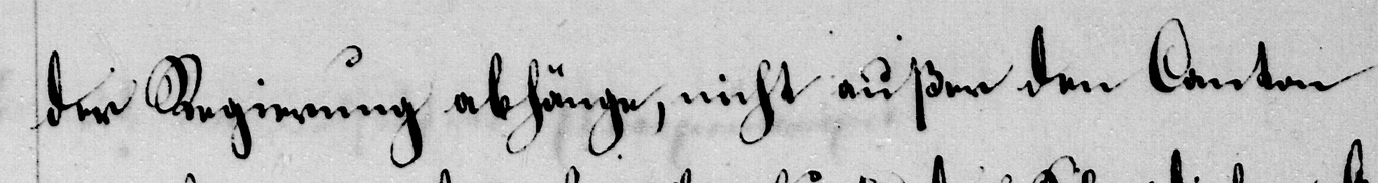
der Regierung abhänge, nicht außer den Canton
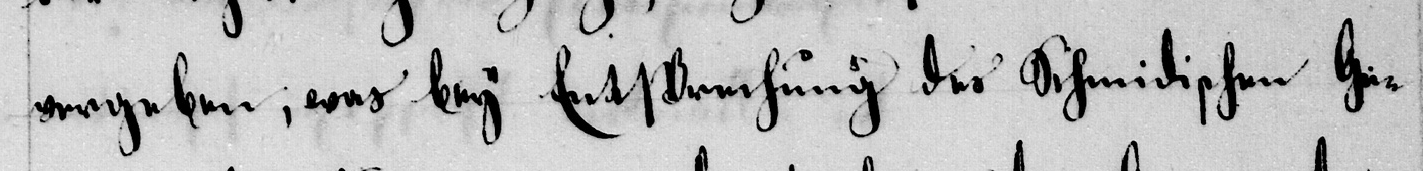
vergeben, was bey Entsprechung des Schmidischen Ge¬
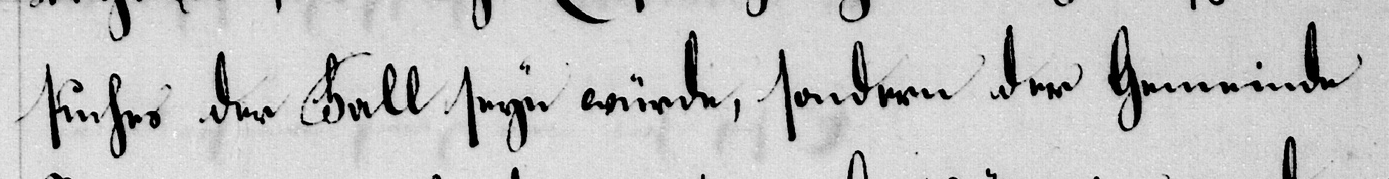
suches der Fall seyn würde, sondern der Gemeinde
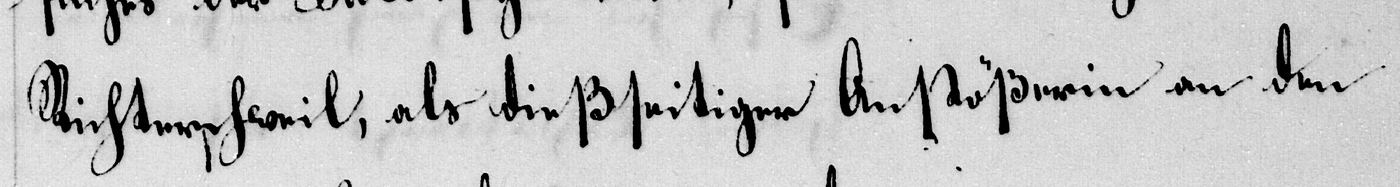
Richterschweil, als dießseitiger Anstößerin an den
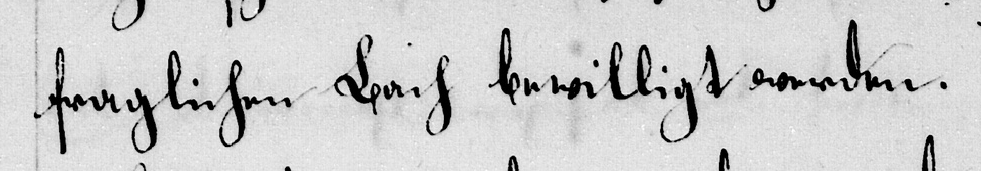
fraglichen Bach bewilligt werden.
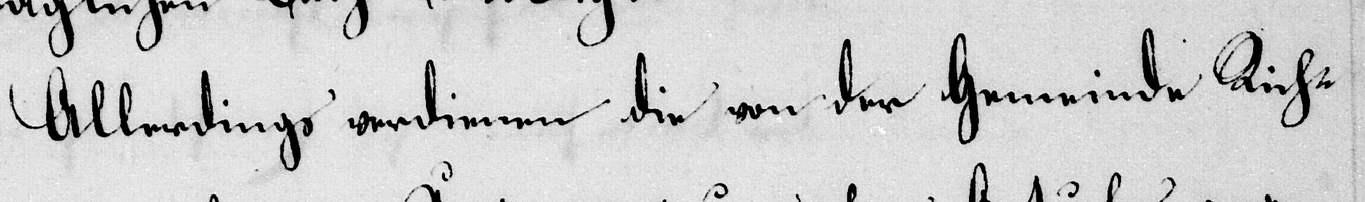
Allerdings verdienen die von der Gemeinde Rich¬
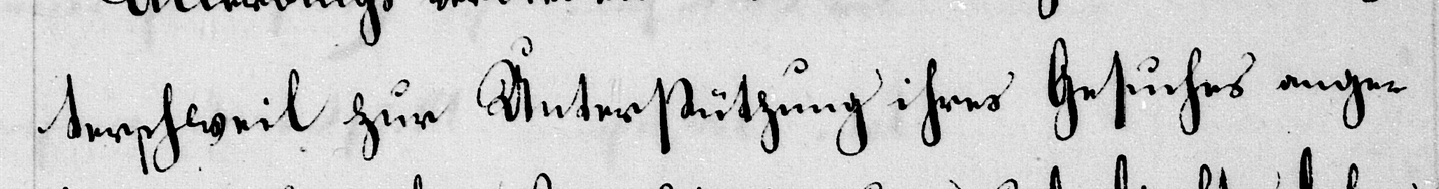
terschweil zur Unterstützung ihres Gesuches ange¬
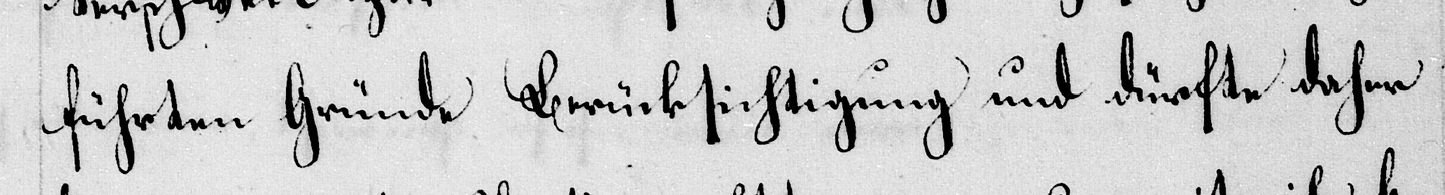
führten Gründe Berücksichtigung und dürfte daher
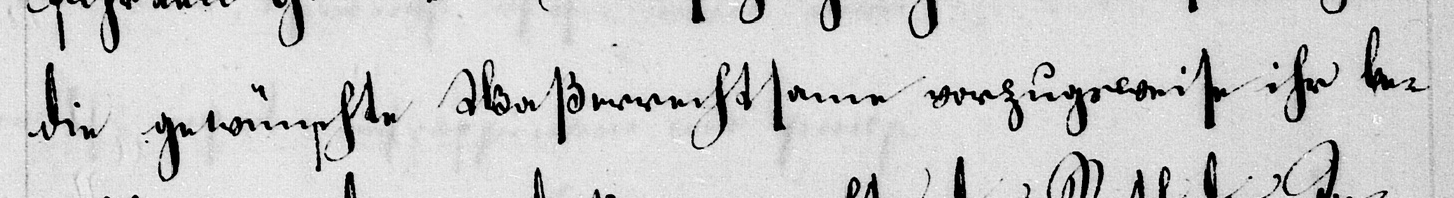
die gewünschte Waßerrechtsame vorzugsweise ihr be¬
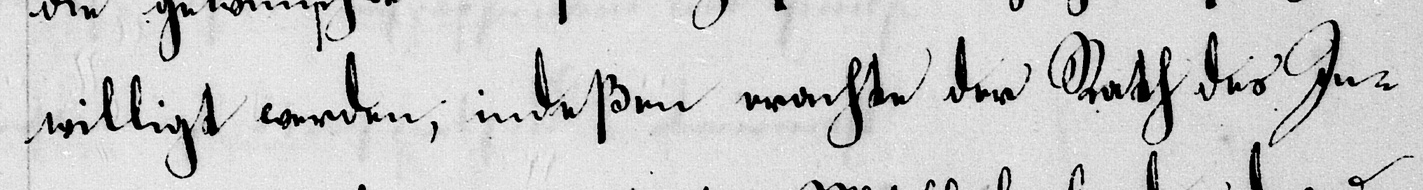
willigt werden, indeßen erachte der Rath des In¬
